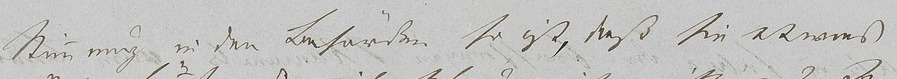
Stimmung in den Behörden so ist, daß sie etwas
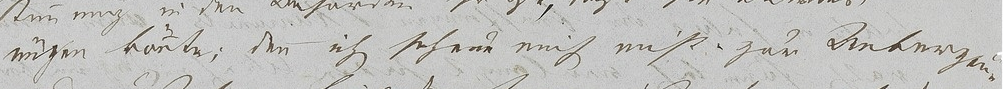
nüzen könnte; denn ich scheue mich nicht zur Ueberzeu-
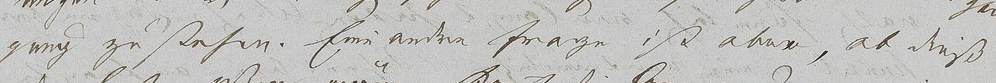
gung zu stehen. Eine andre Frage ist aber, ob dieß
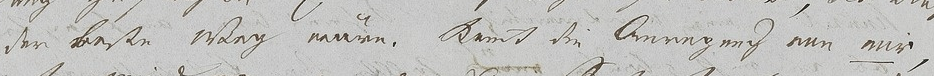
der beste Weg wäre. Kommt die Anregung von mir,
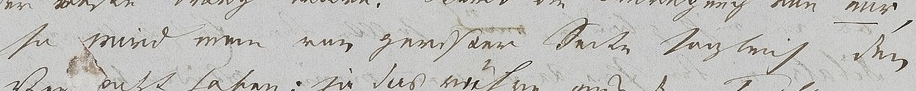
so wird man von gewißer Seite sogleich den
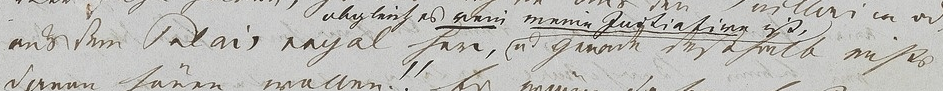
aus dem Palais royal her, obgleich es rein meine Initiative ist, u. gerade
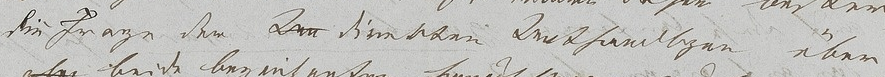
die Frage der Un direkten Unthandlgen über
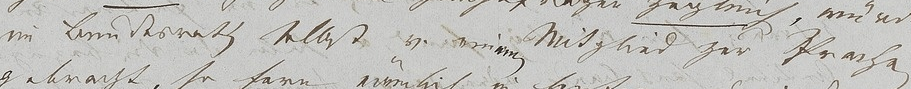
im Bundesrath selbst v. einem Mitglied zur Sprache
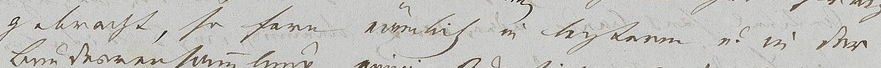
gebracht, so fern nämlich in lezterm u. in der
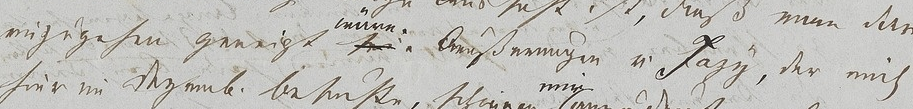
einzugehen geneigt seiwäre. Aeußerungen v. Fazy, der mich
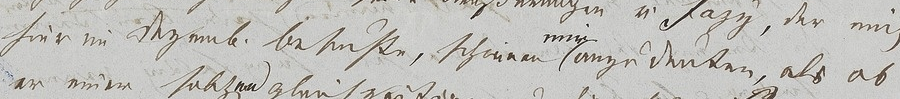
hier im Dezemb. besuchte, scheinen mir anzudeuten, als ob
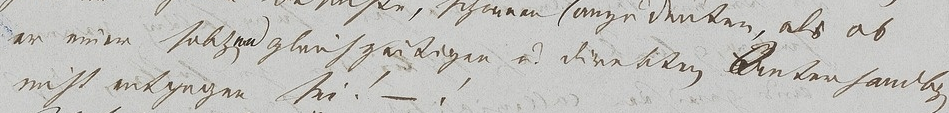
er einer solchen gleichzeitigen u. direkten Unterhandlgen
